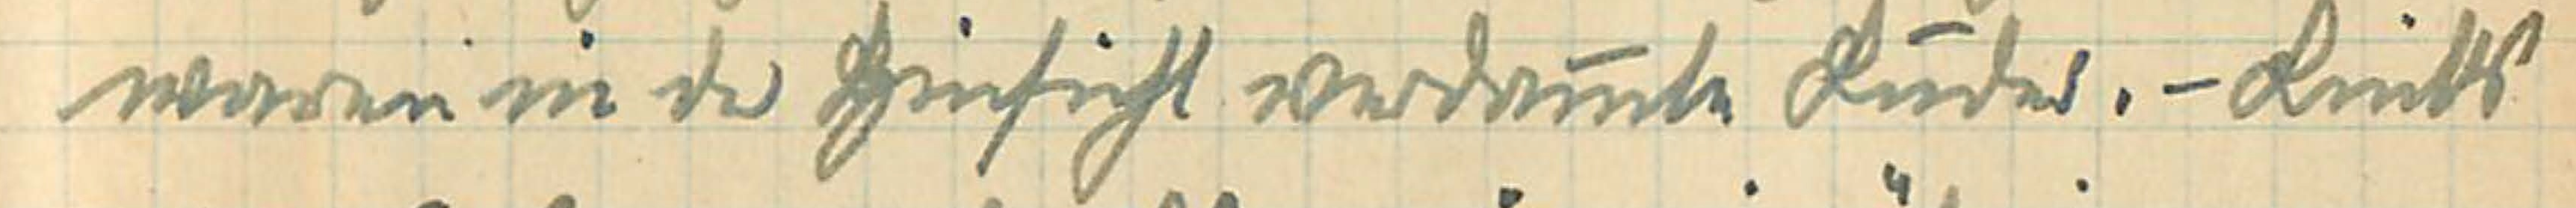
waren in der Hinsicht verdammte Luder. – Links
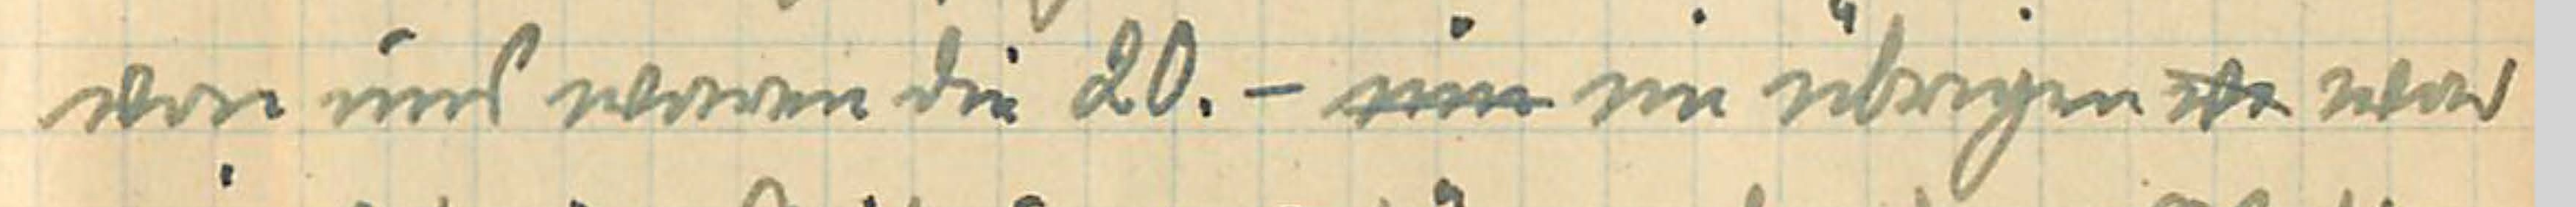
von uns waren die 20. – inn im übrigen v war
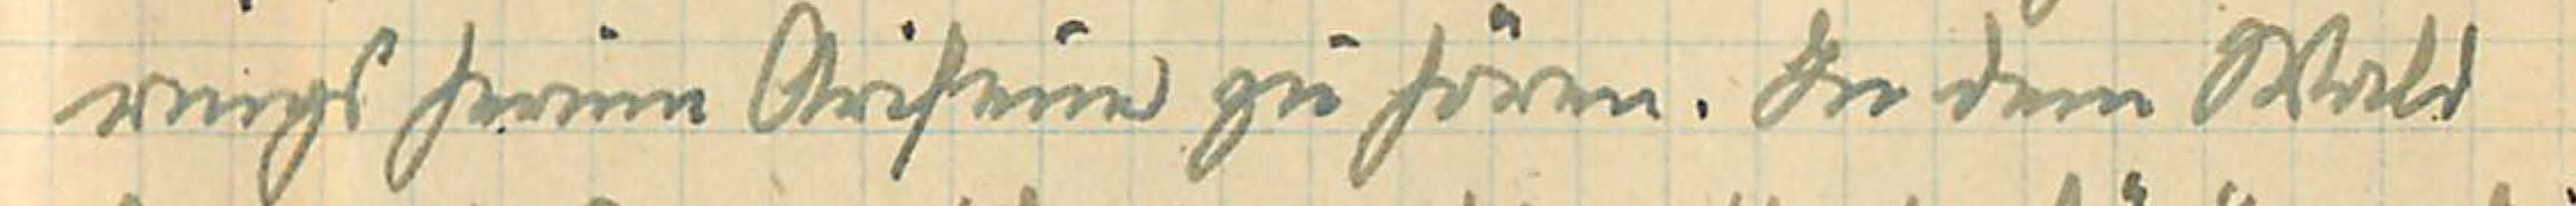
rings herum Arifeuer zu hören. In dem Wald
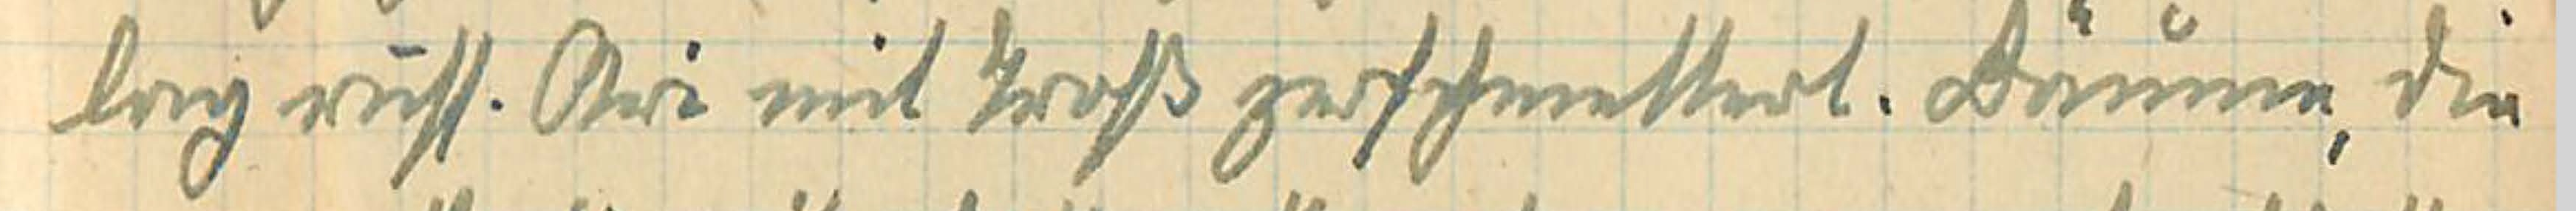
lag russ. Ari mit Troß zerschmettert. Bäume, die
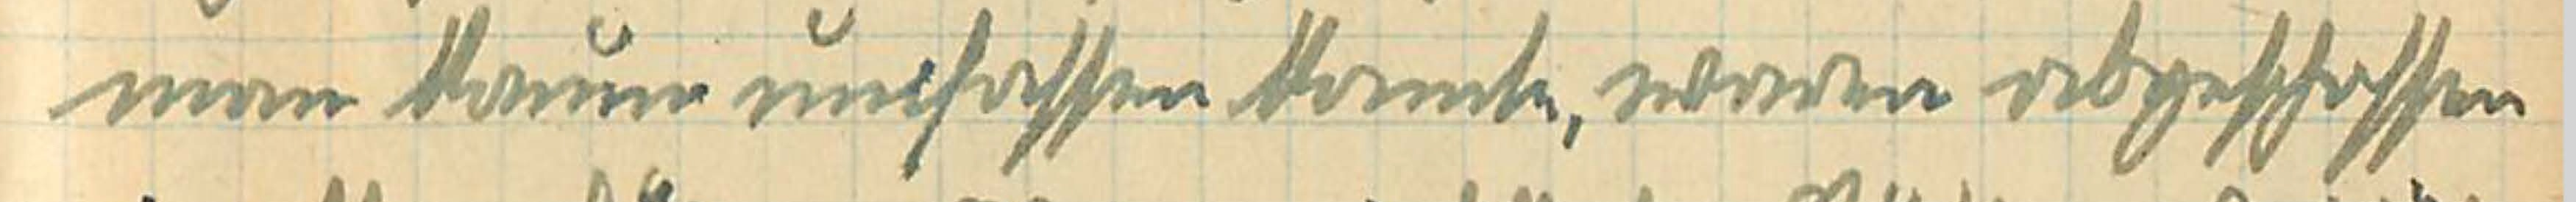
man kaum umfassen konnte, waren abgeschossen
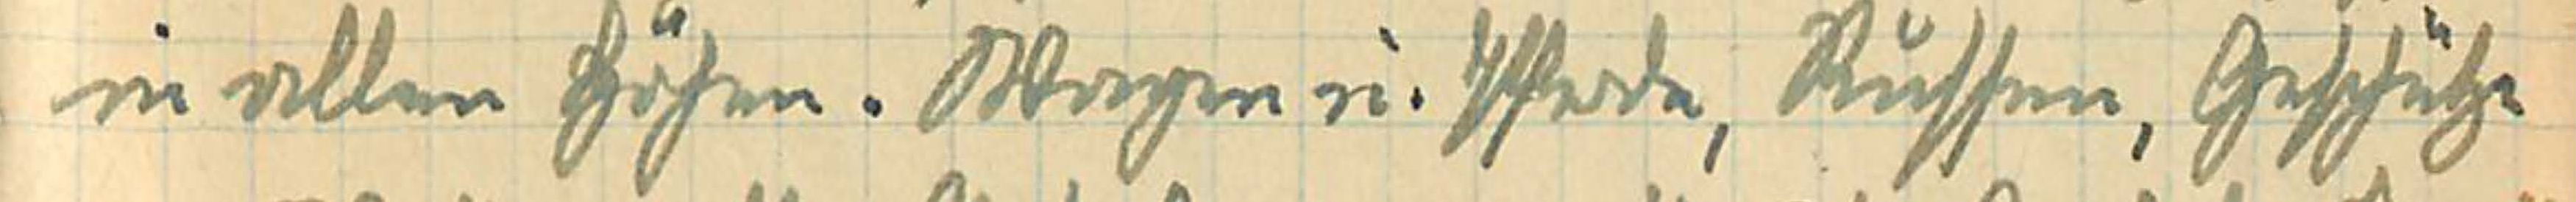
in allen Höhen. Wagen u. Pferde, Russen, Geschütze
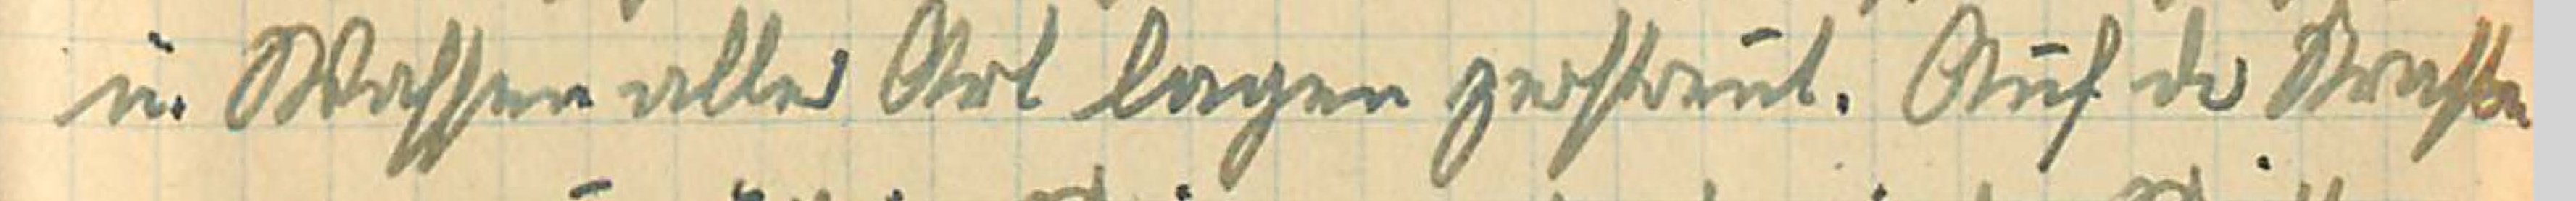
u. Waffen aller Art lagen zerstreut. Auf der Straße
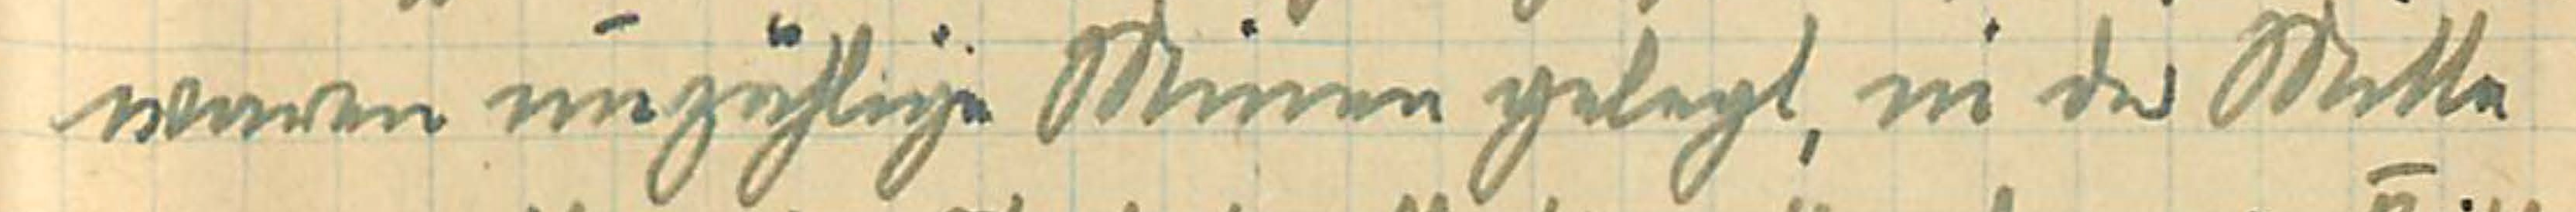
waren unzählige Minen gelegt, in der Mitte
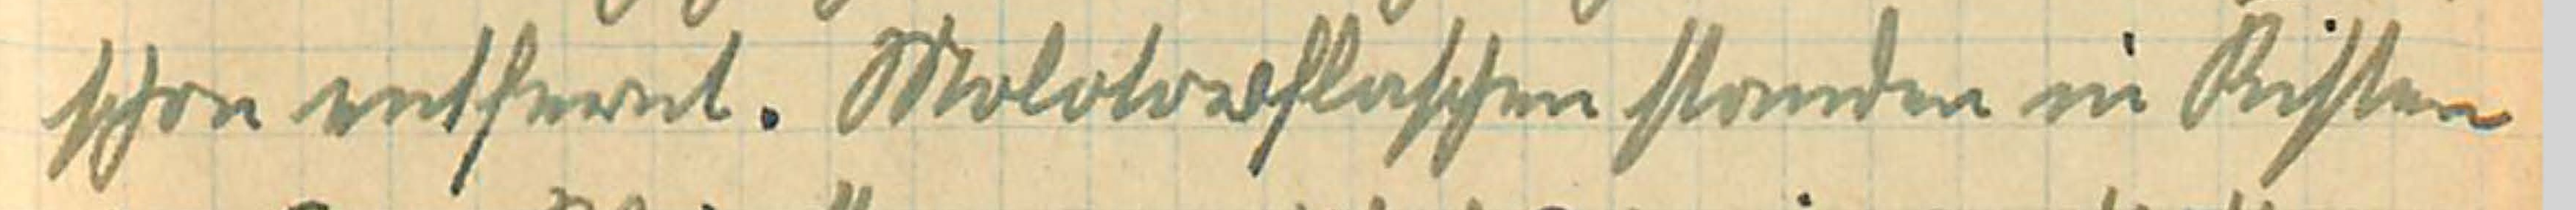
schon entfernt. Molotovflaschen standen in Kisten
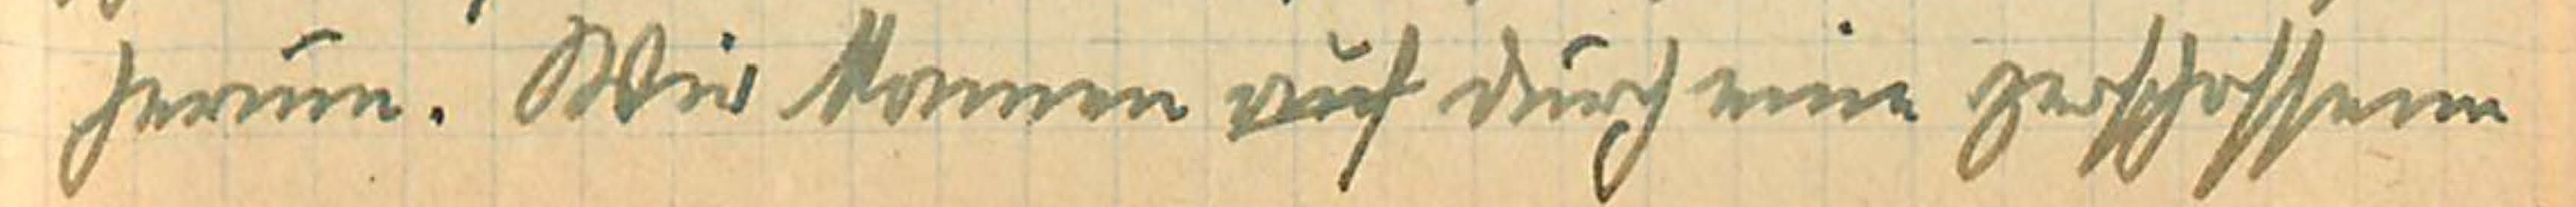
herum. Wir kamen auf durch eine zerschossene
